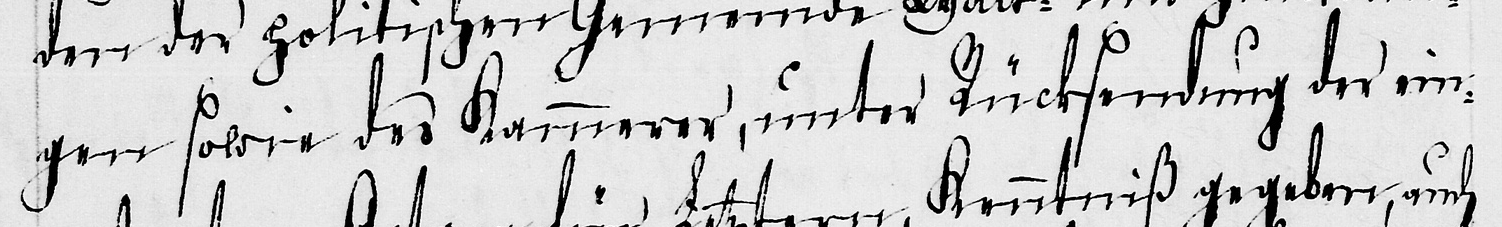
gen sowie des Kammerer, unter Rücksendung der ein¬
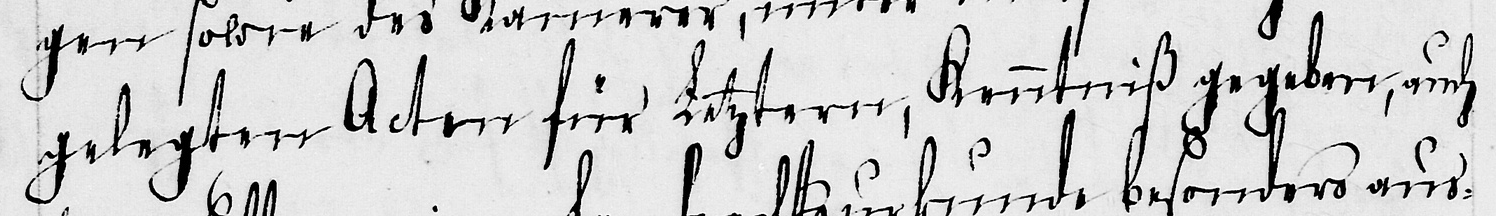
gelegten Acten für Letztern, Kenntniß gegeben, auch
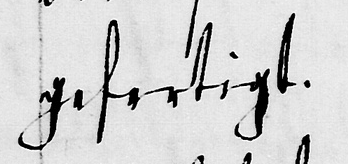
gefertigt.
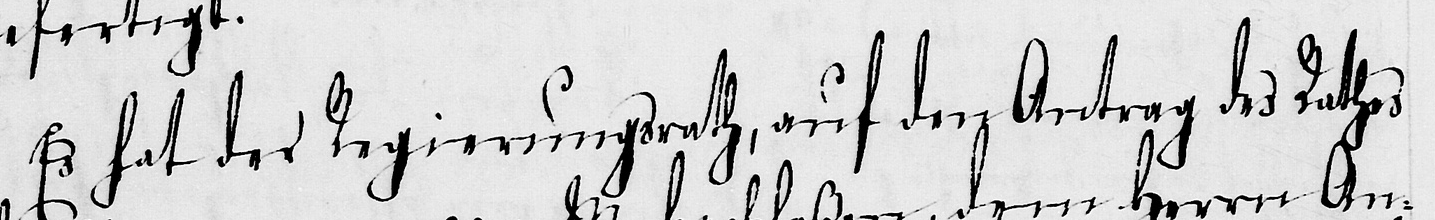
Es hat der Regierungsrath, auf den Antrag des Rath¬
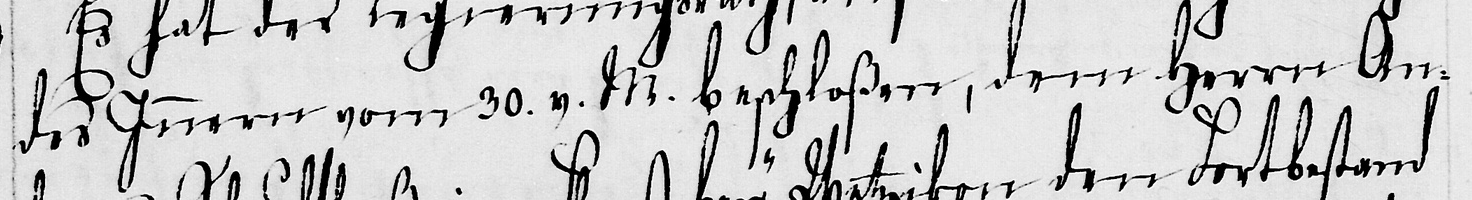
des Innern vom 30. v. M. beschloßen, dem Herrn An¬
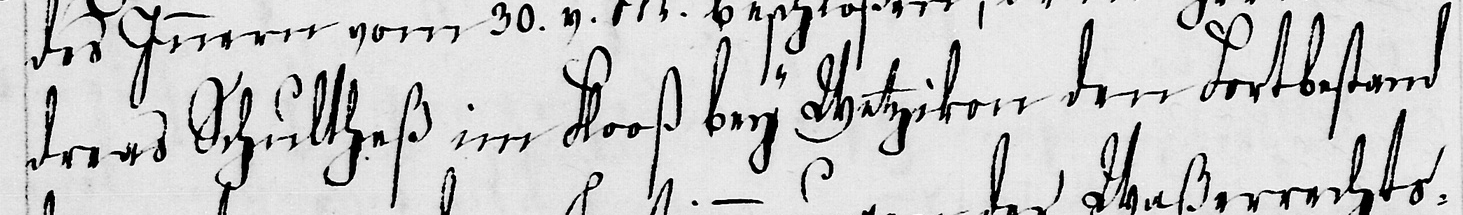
dreas Schultheß im Flooß bey Wetzikon den Fortbestand
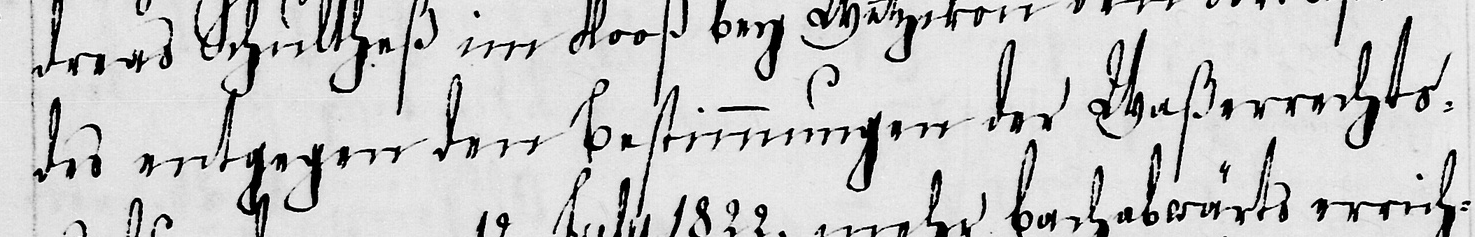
des entgegen den Bestimmungen der Waßerrechts¬
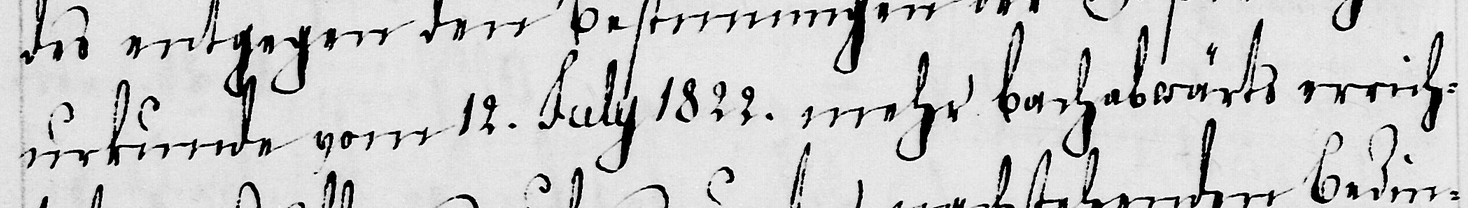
urkunde vom 12. July 1822. mehr bachabwärts errich¬
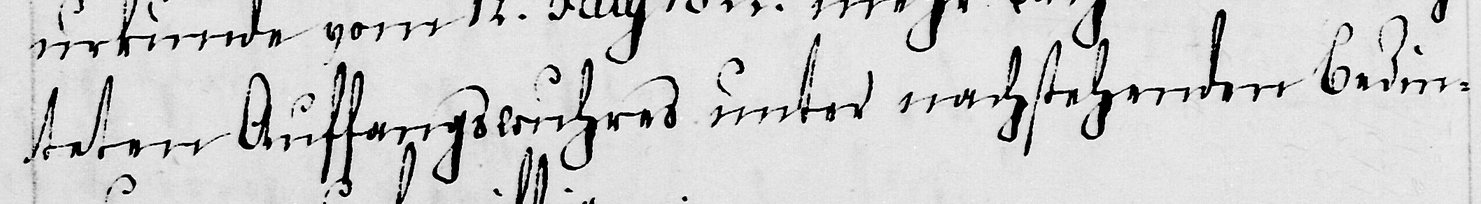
teten Auffangswuhres unter nachstehenden Bestim¬
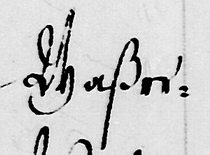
Waßer-
